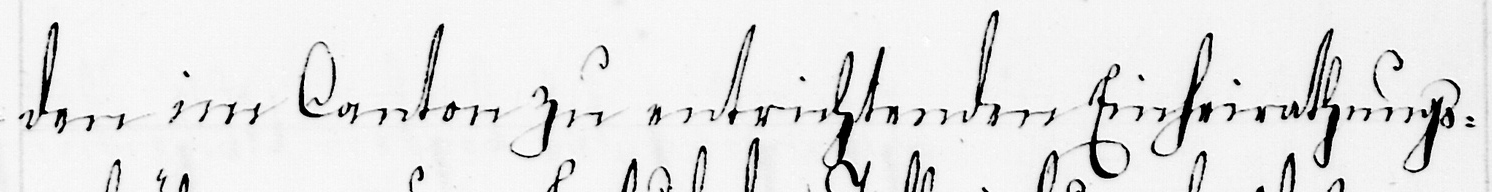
den im Canton zu entrichtenden Einheirathungs¬
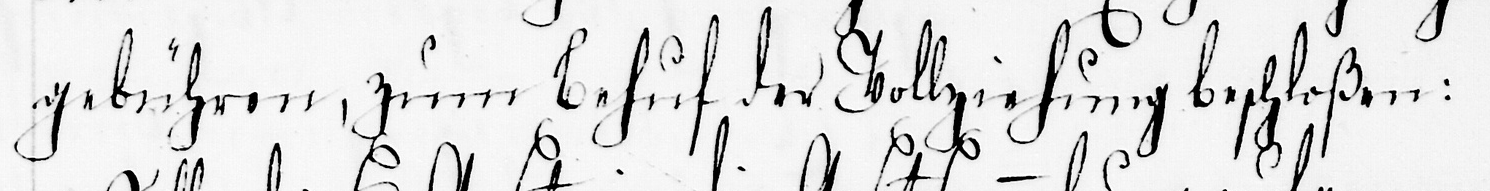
gebühren, zum Behuf der Vollziehung beschloßen:
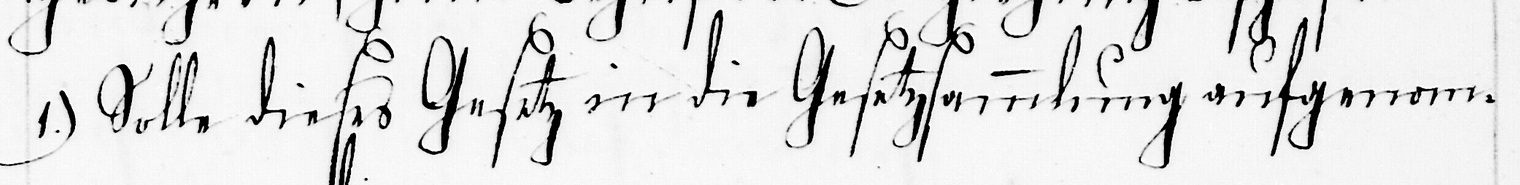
1.) Solle dieses Gesetz in die Gesetzsammlung aufgenom¬
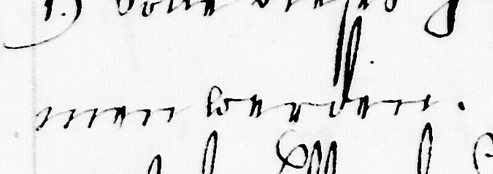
men werden.
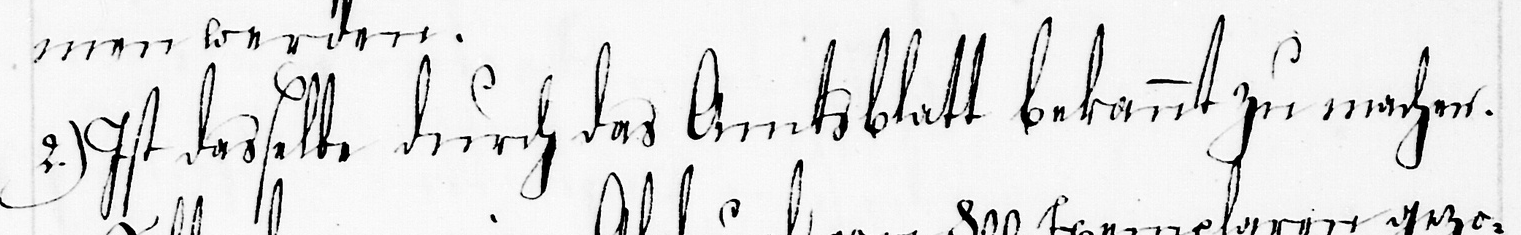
Ist dasselbe durch das Amtsblatt bekannt zu machen.
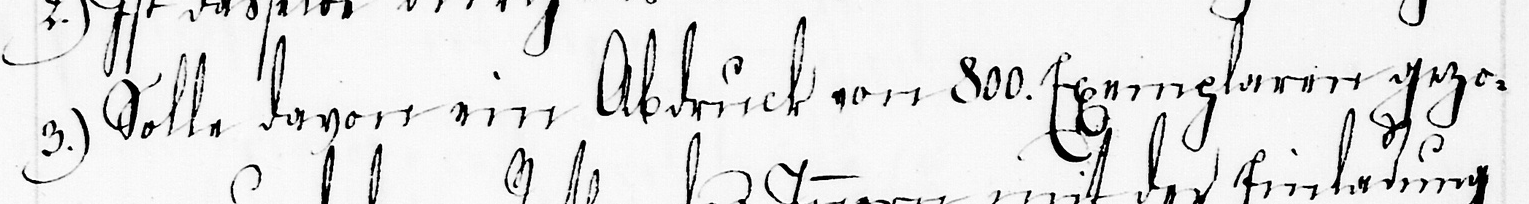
3.) Solle davon ein Abdruck von 800. Exemplaren gezo¬
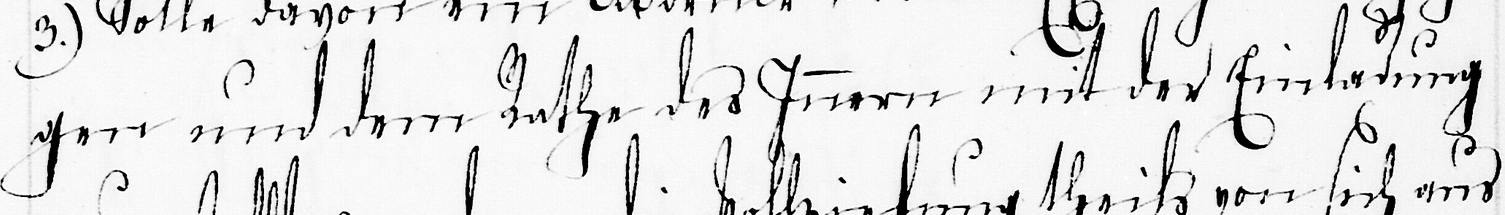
gen und dem Rathe des Innern mit der Einladung
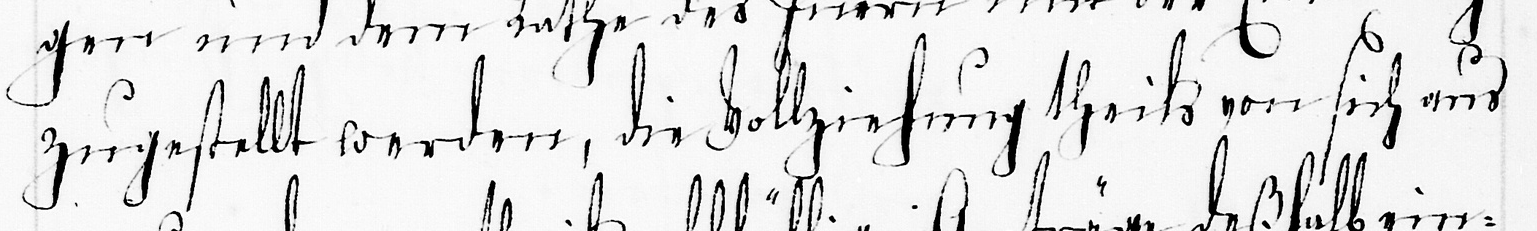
zugestellt werden, die Vollziehung theils von sich aus
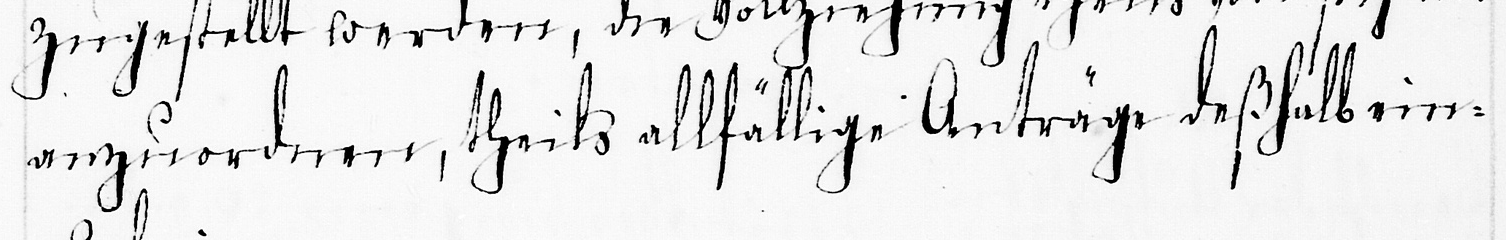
anzuordnen, theils allfällige Anträge deßhalb ein¬
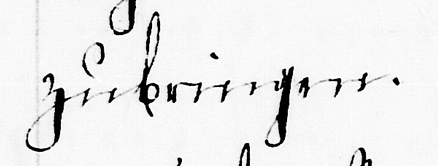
zubringen.
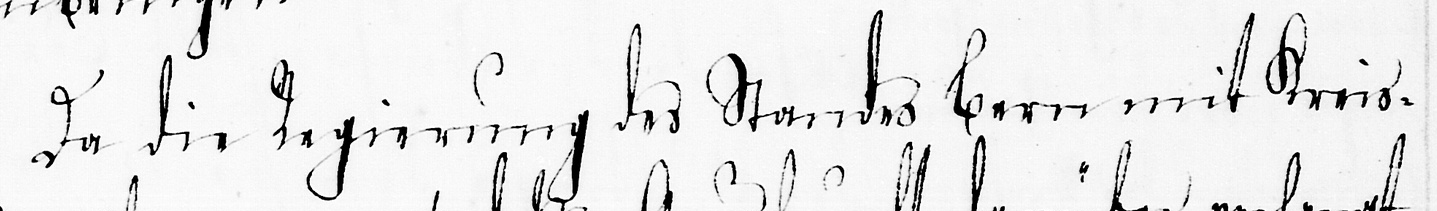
Da die Regierung des Standes Bern mit Kreis¬
